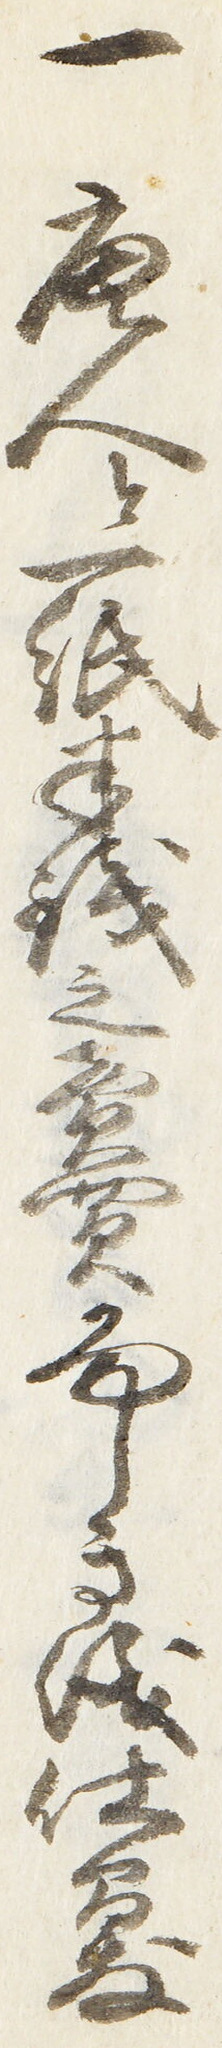一唐人と一紙半銭之売買かましき儀仕間敷
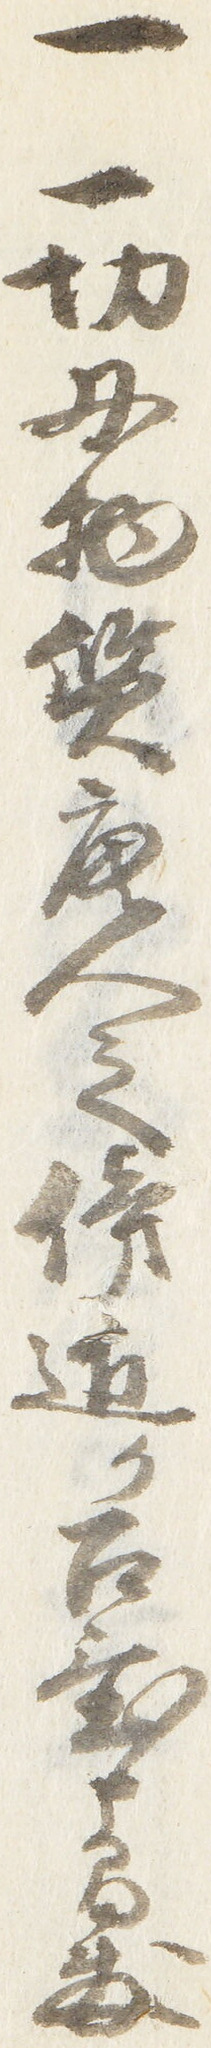一一切物質唐人之傍近ク召置申間敷
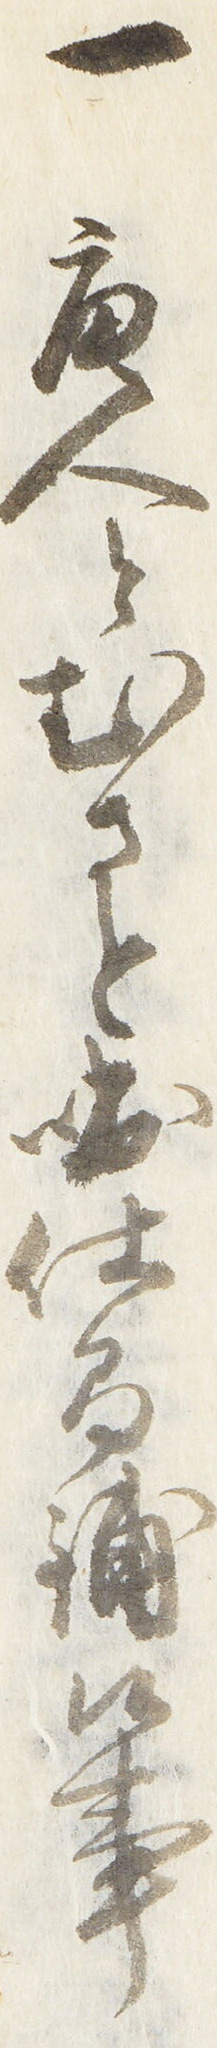一唐人とむさと咄仕間鋪候事
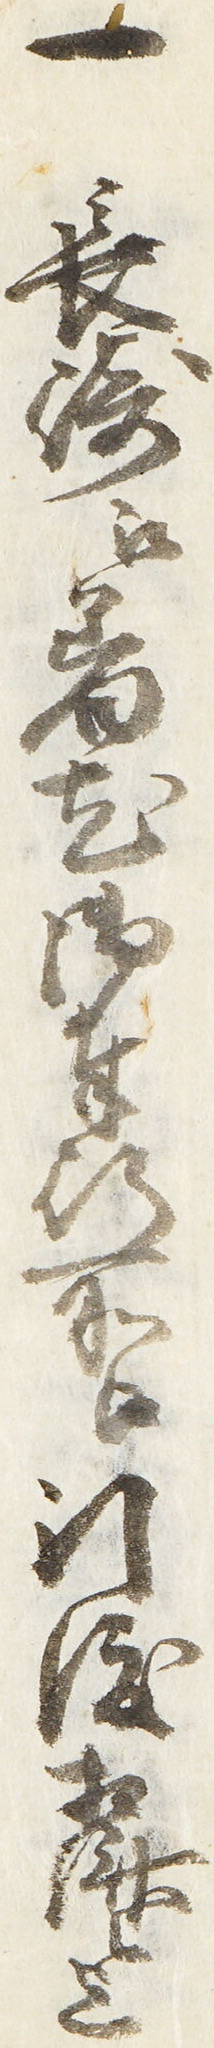一長崎江着尤御奉行所江引渡相済候迄
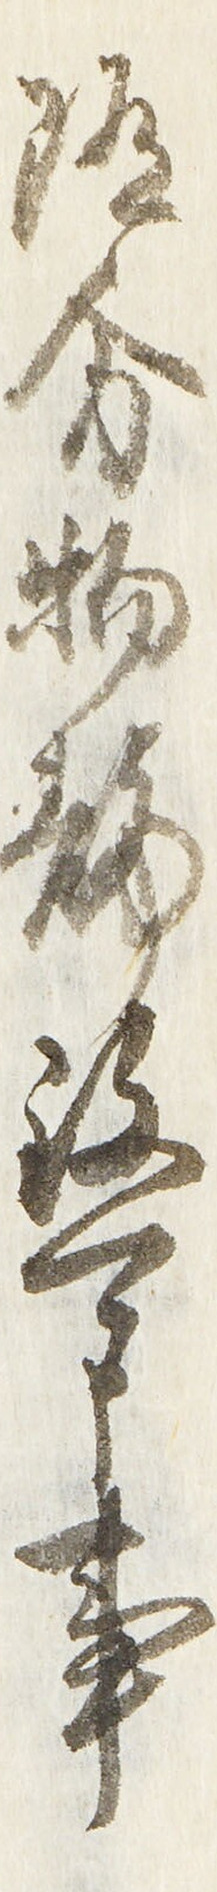随分物静致可申事
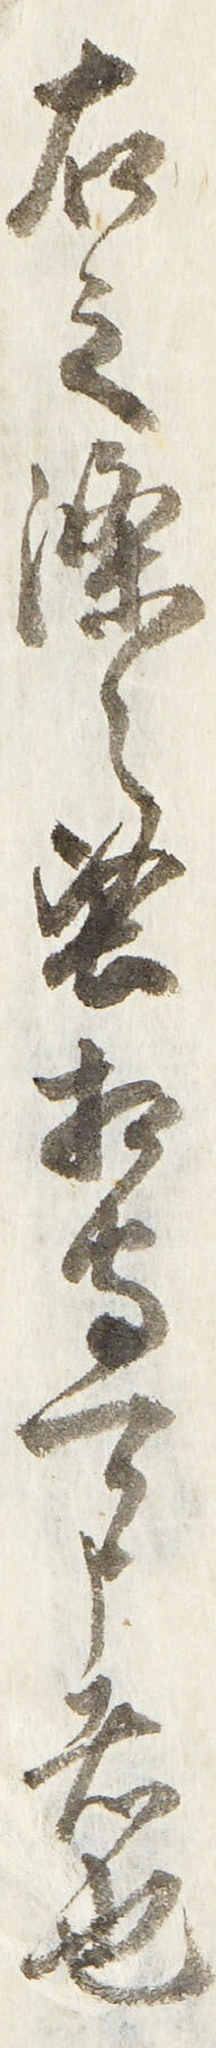右之条々堅相守可申者也
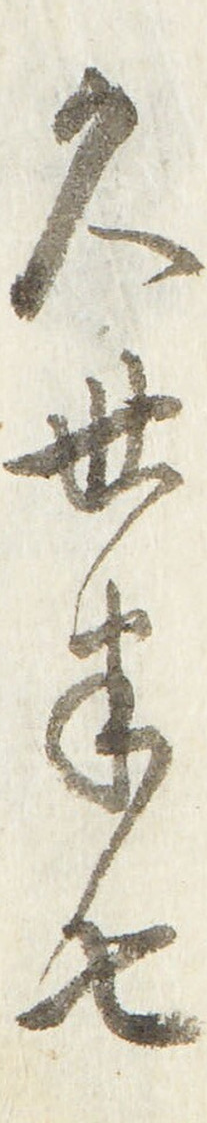久世半七

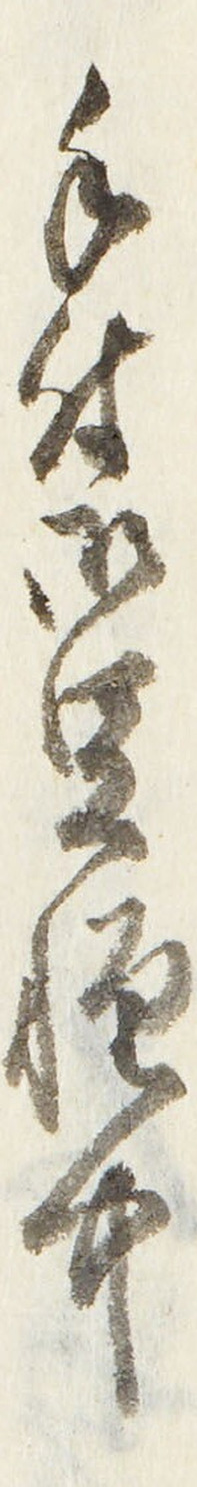手付御足軽中
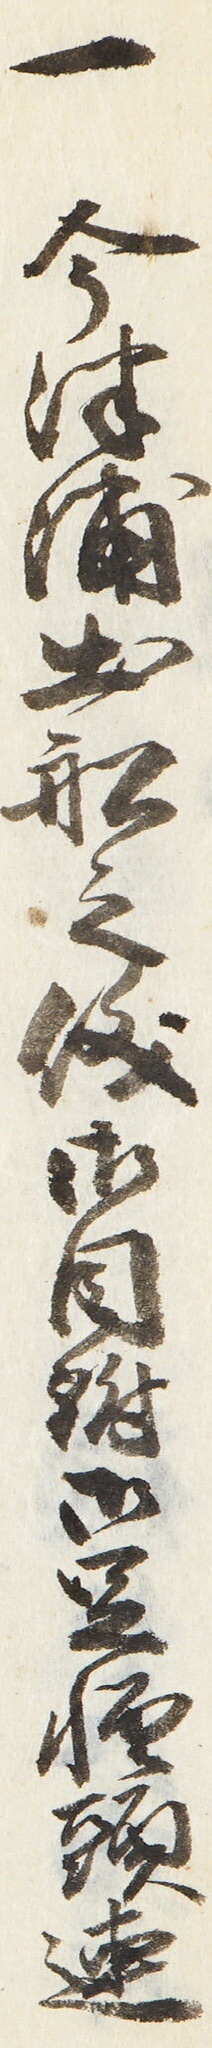一今津浦出船之儀御目付御足軽頭連
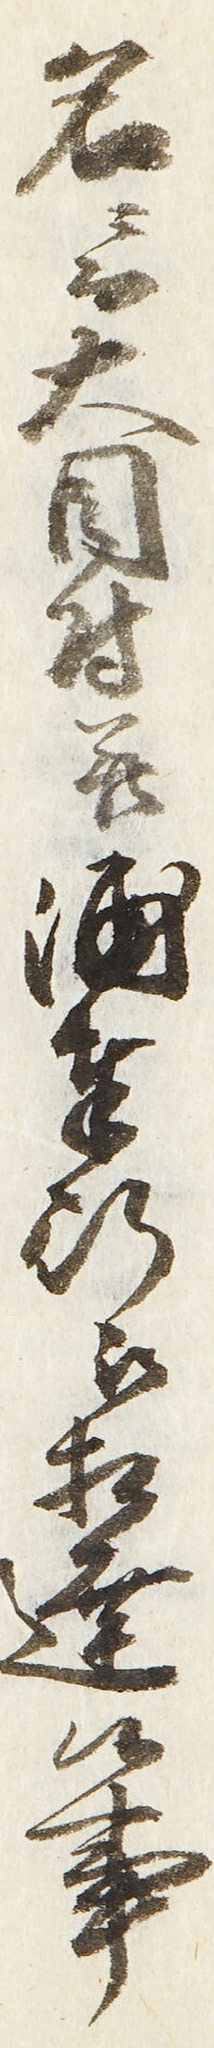名ニ而大目付并浦奉行江相達候事
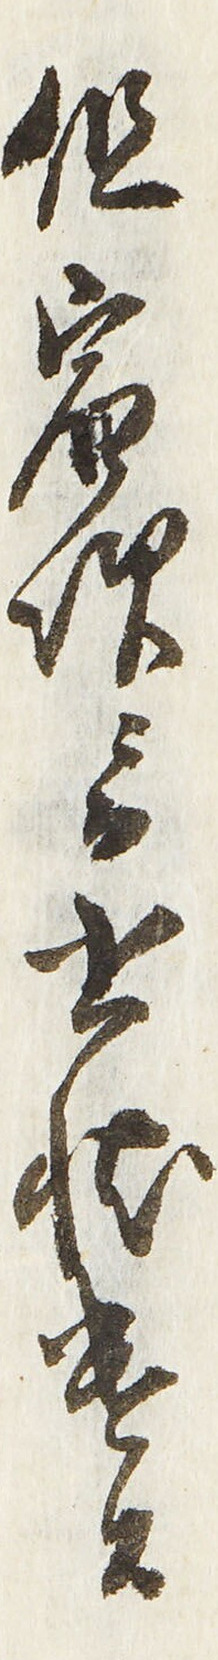但宿次ニ而書状遣ス
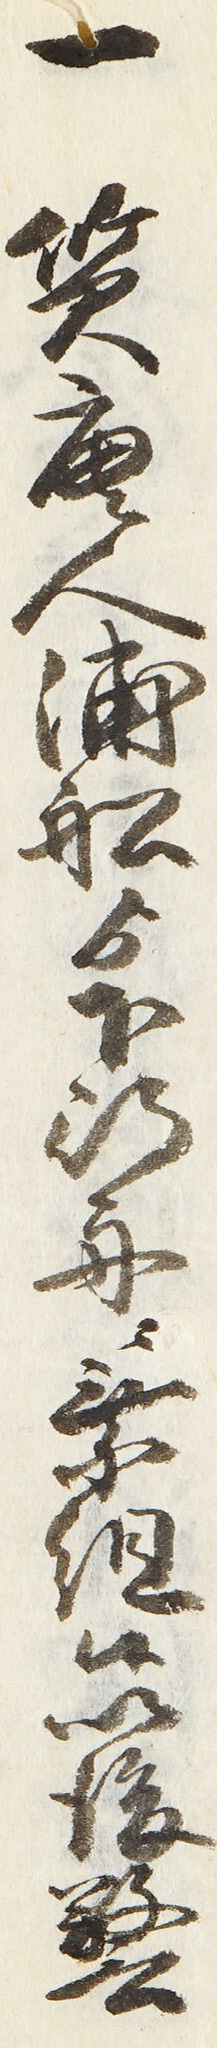一質唐人浦船ゟ下行舟ニ乗組候以後警
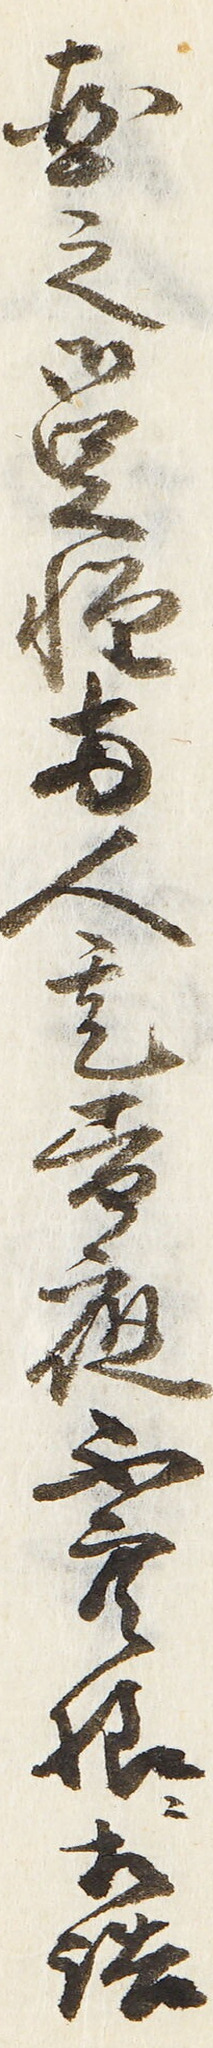固之御足軽両人充昼夜不空様ニ相詰
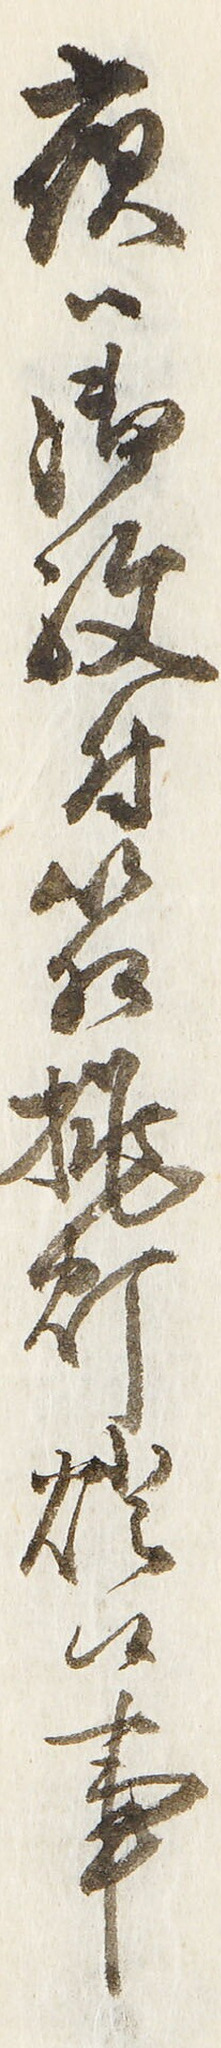夜ハ御紋付箱挑灯燈候事
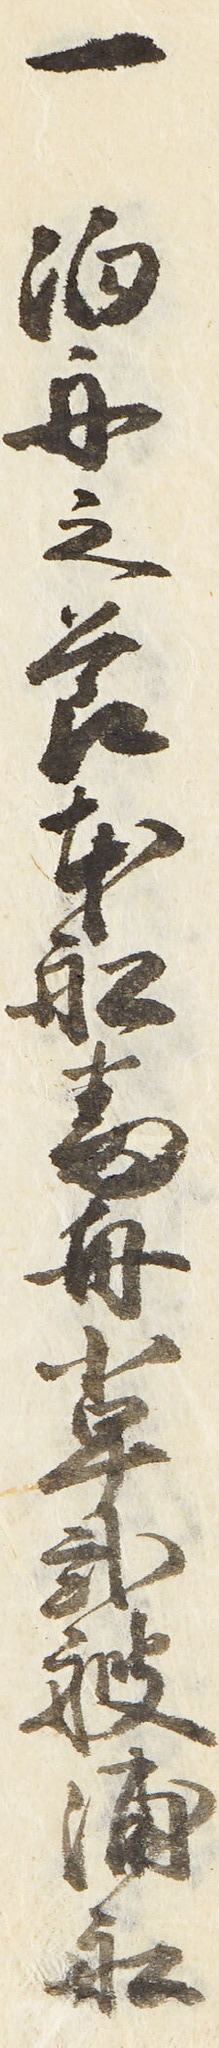一泊舟之節本船番舟小早弐艘浦船
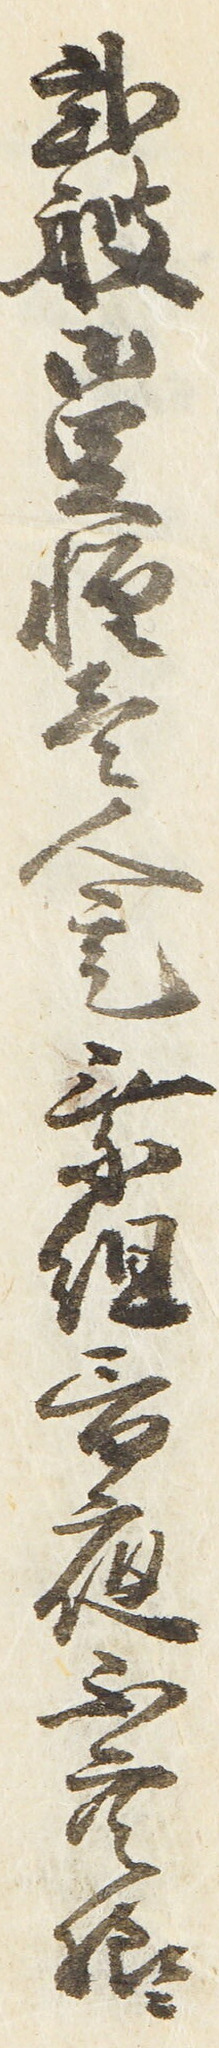弐艘御足軽壱人充乗組昼夜不空様ニ
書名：玄海嶋江漂着船為警固長崎江被越候覚
